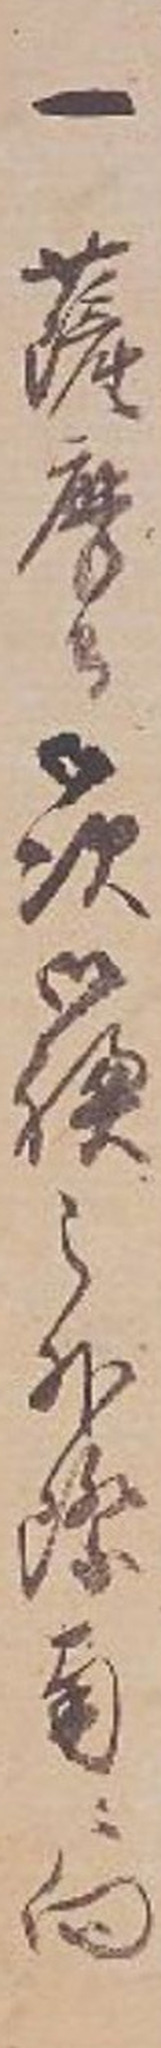一薩摩守御次御襖之外際南に向
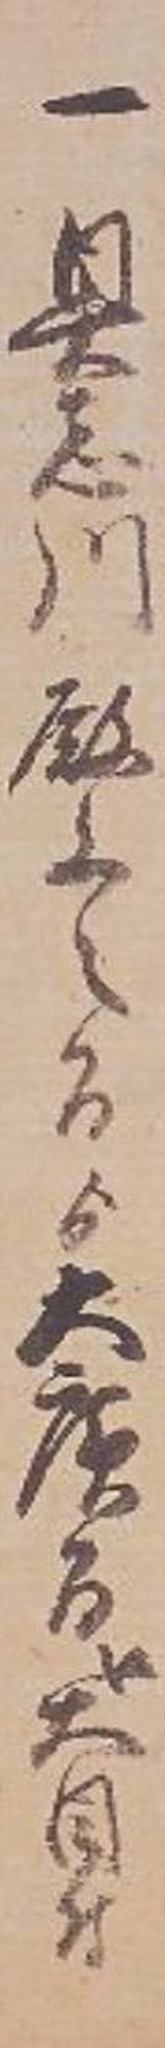一具志川殿上之間ゟ大広間え大目付
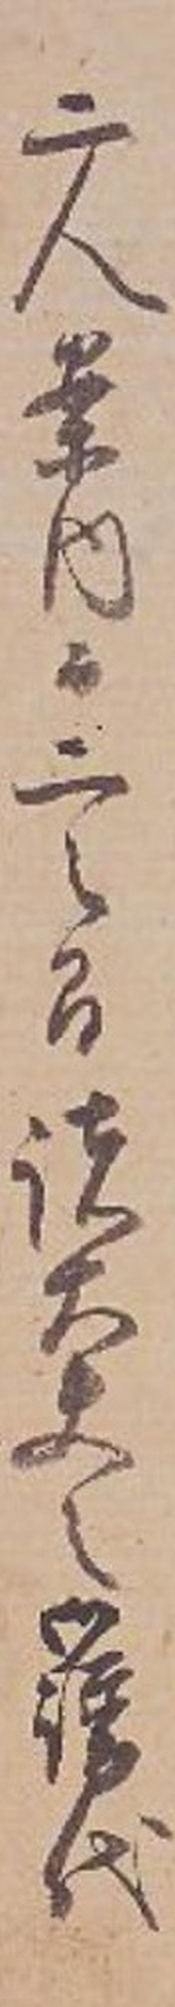二人案内而二之間諸大夫之御譜代

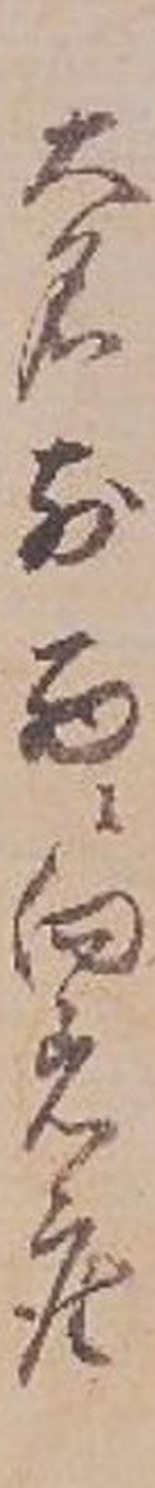大名前西に向着座
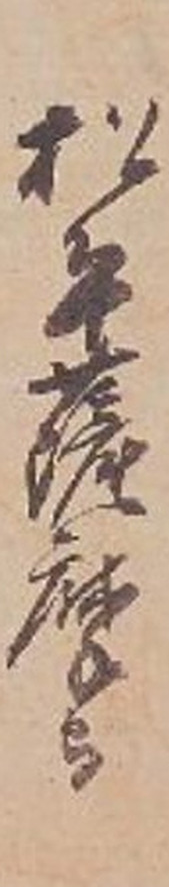松平薩摩守
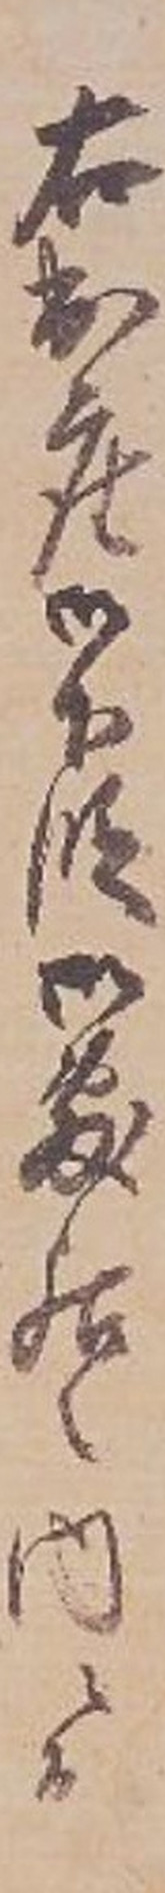右出座御下段御敷居之内に而
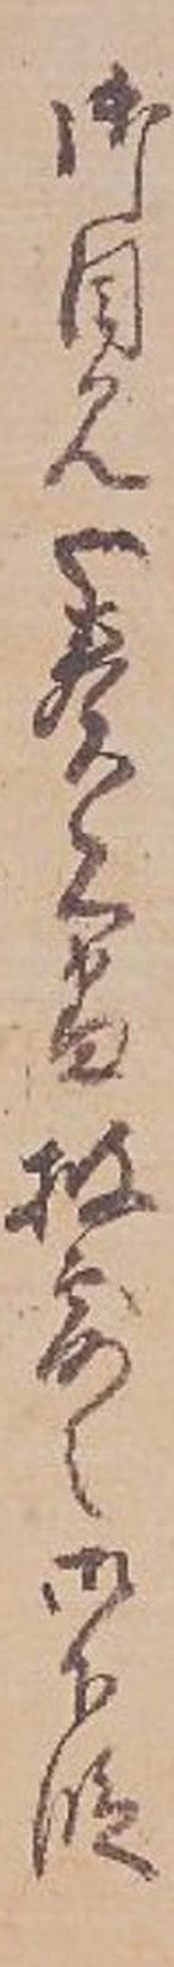御目見御奏者番披露之御下段
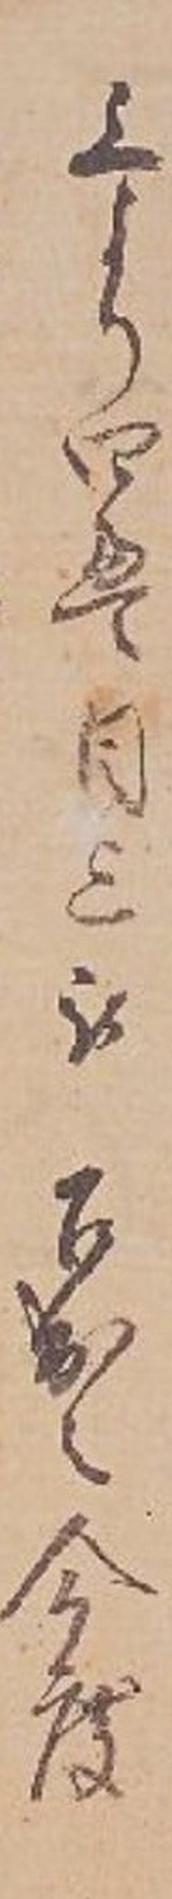上より四畳目迄被召出之今度
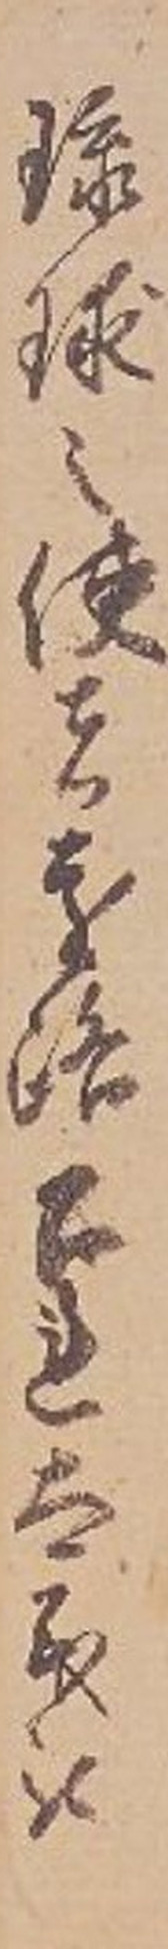琉球之使者遠路召連太義被
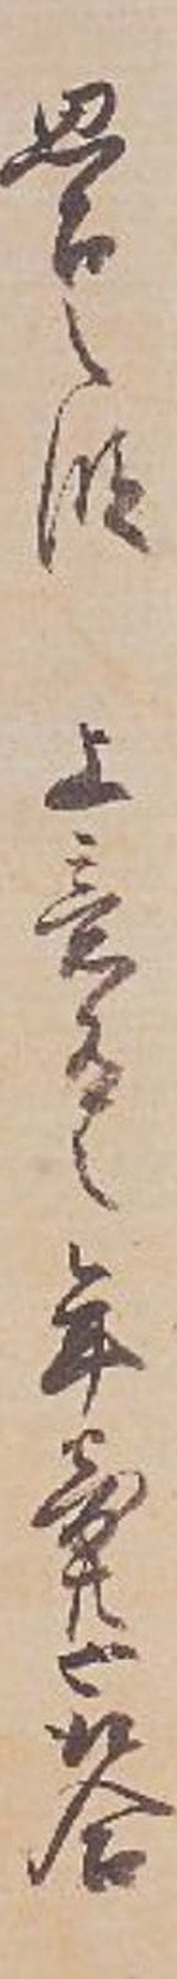思召之段上意有之年寄共御取合
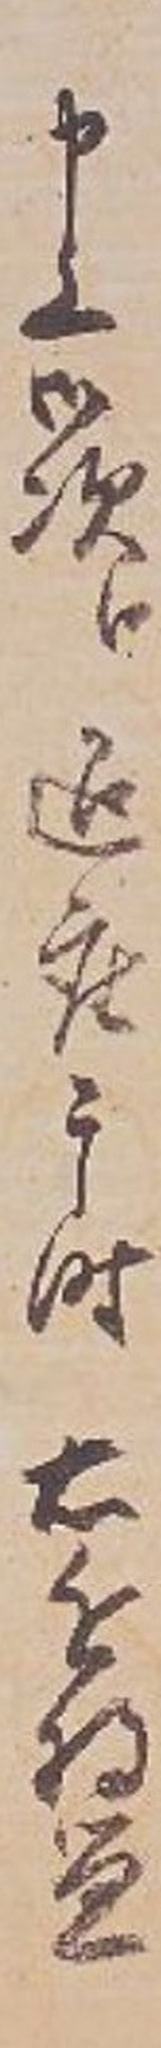申上御次え退座于時右近将監
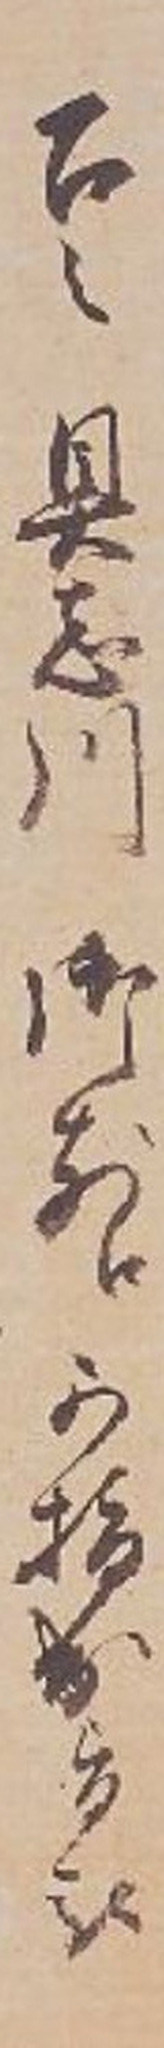召之具志川御前え可指出旨被
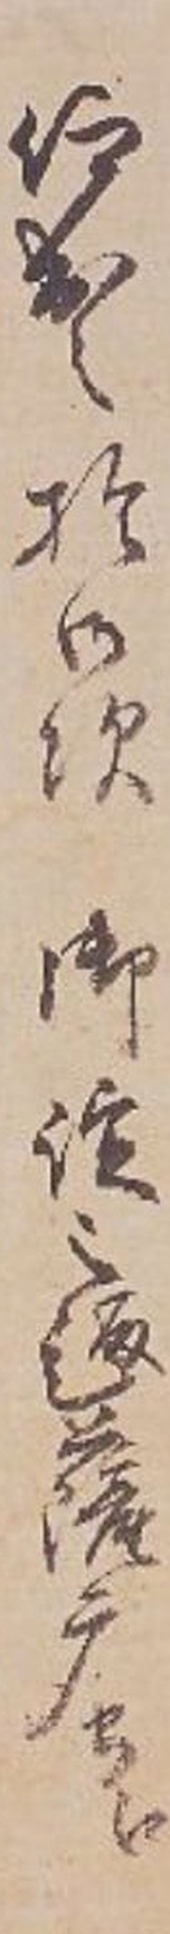仰出之於御次御諚之趣薩摩守え
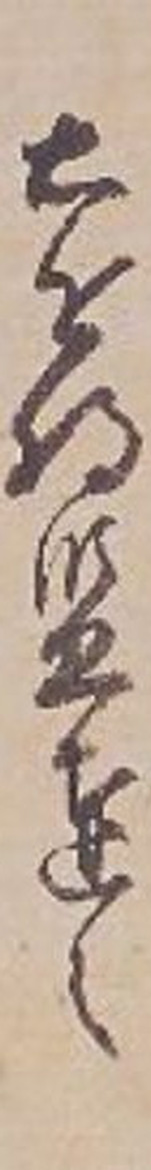右近将監達之
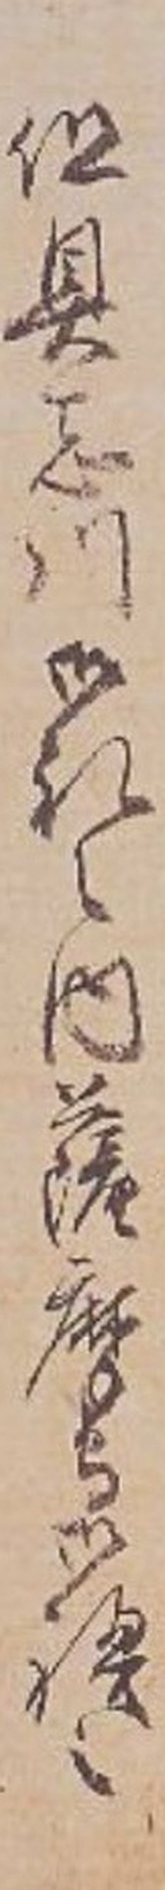但具志川御礼之内薩摩守御襖之

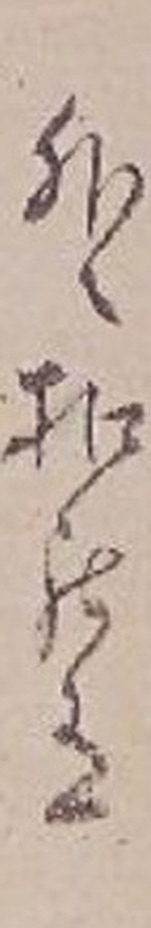外に控罷有
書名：琉球人来朝記 五、六、七
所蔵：University of the Ryukyus Library
